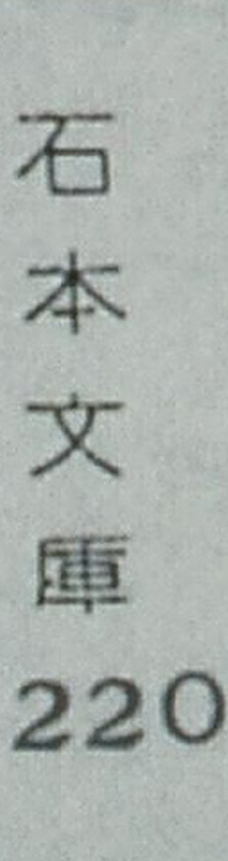石本文庫

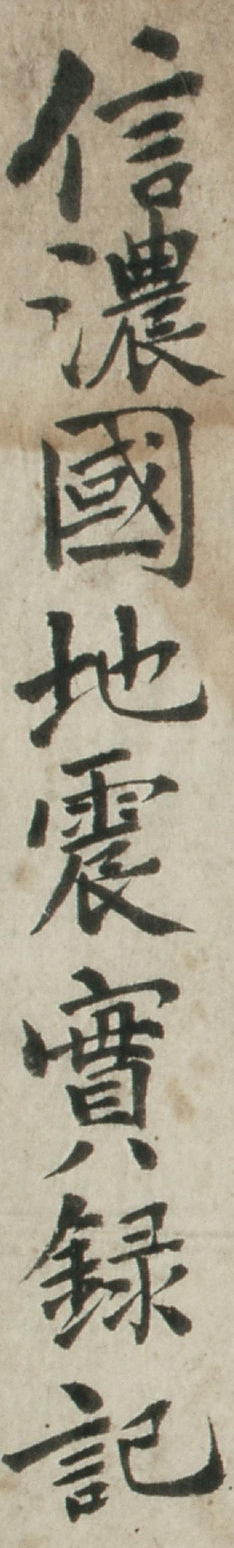信濃国地震実録記

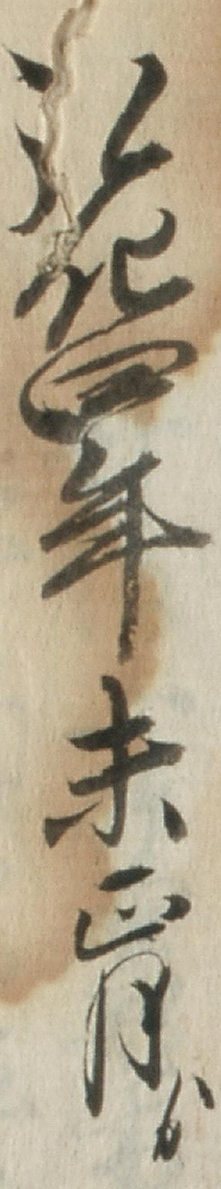弘化四年未正月ゟ
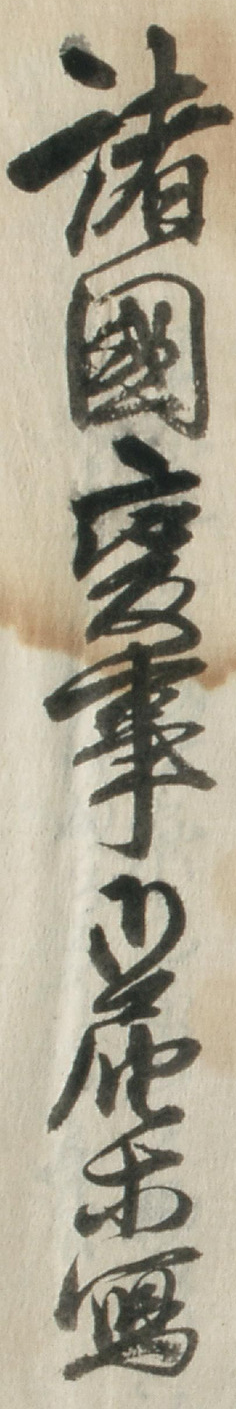諸国変事御届等写

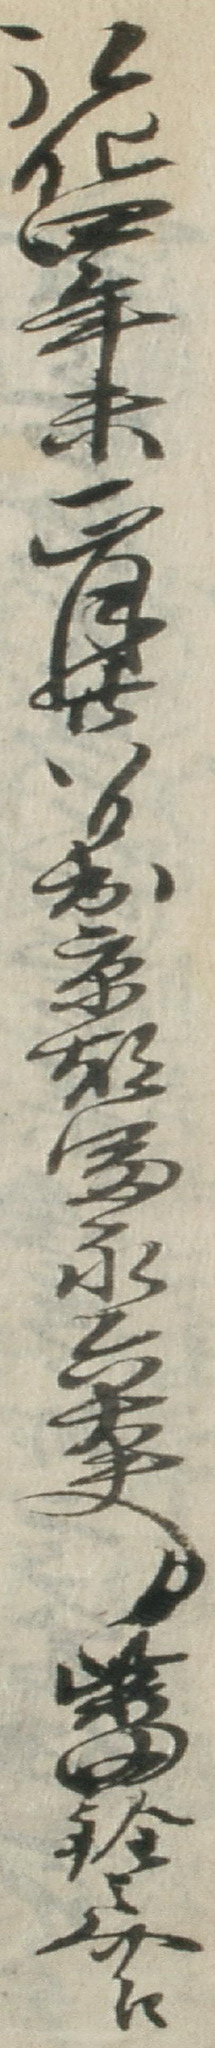弘化四年未正月廿八日於京都冨永六太夫ゟ柴田鈴之介江
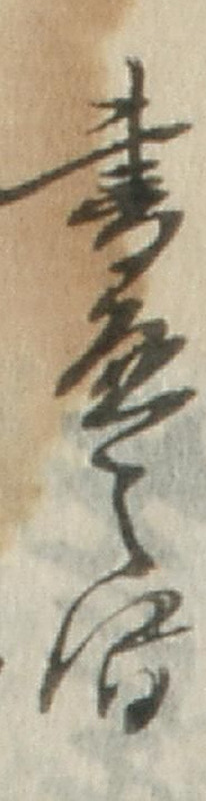書通之写
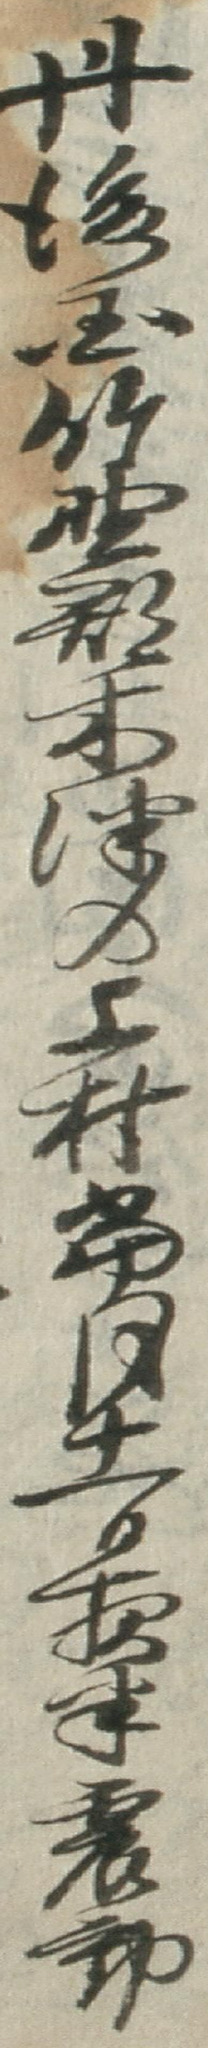丹後国竹野郡木津の上村当月十一日夜半震動
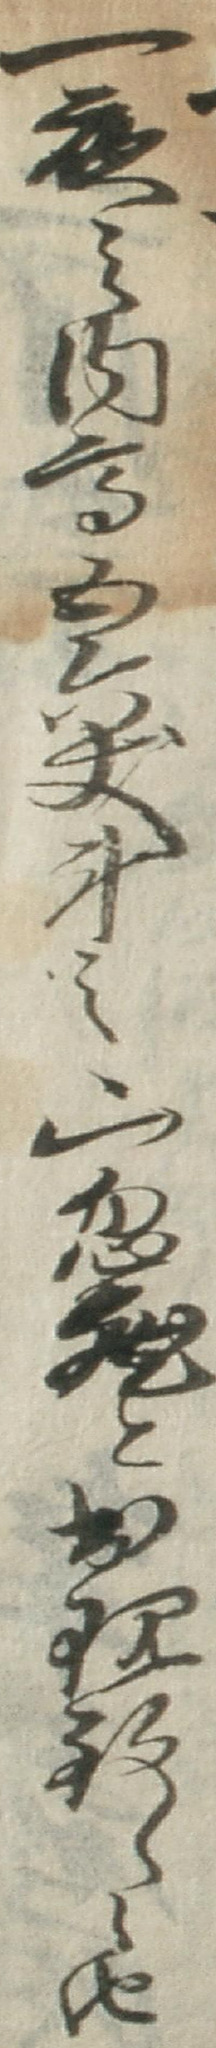一夜之内高五六丈計之山忽然と出現致し候由
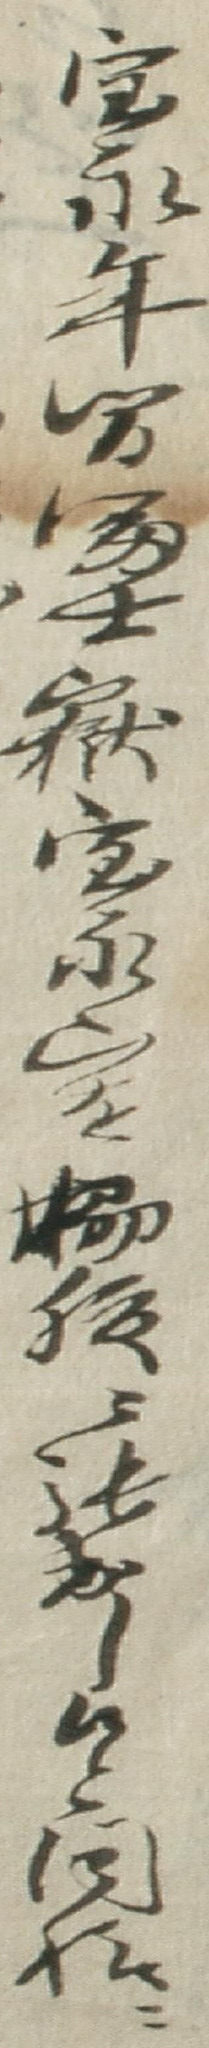宝永年間冨士嶽宝永山を脇腹二張出し候と同様二
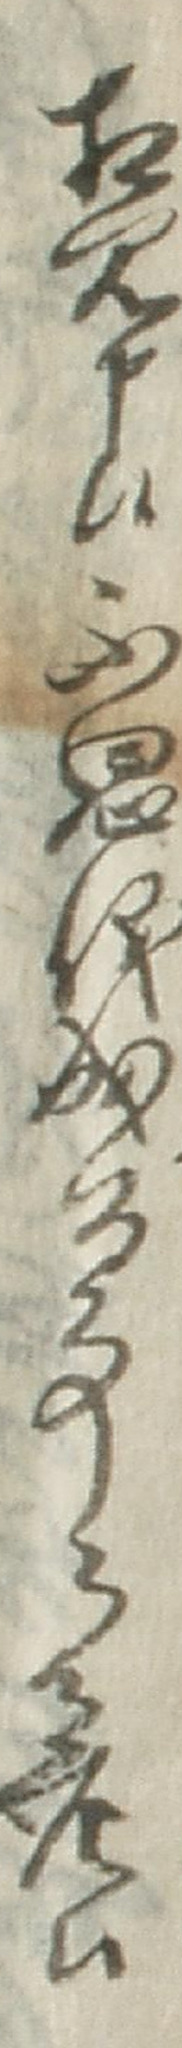相見申候不思議成る事二御座候
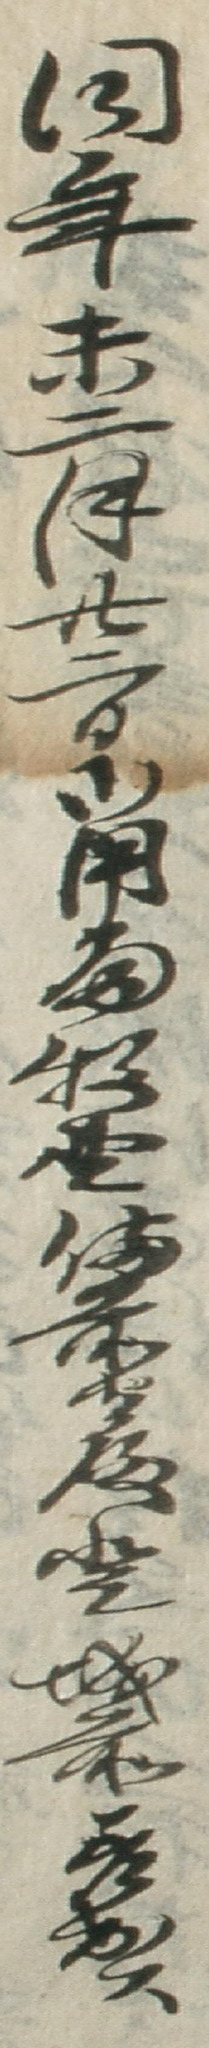同年未二月廿二日御用番牧野備前守殿登城前差出ス
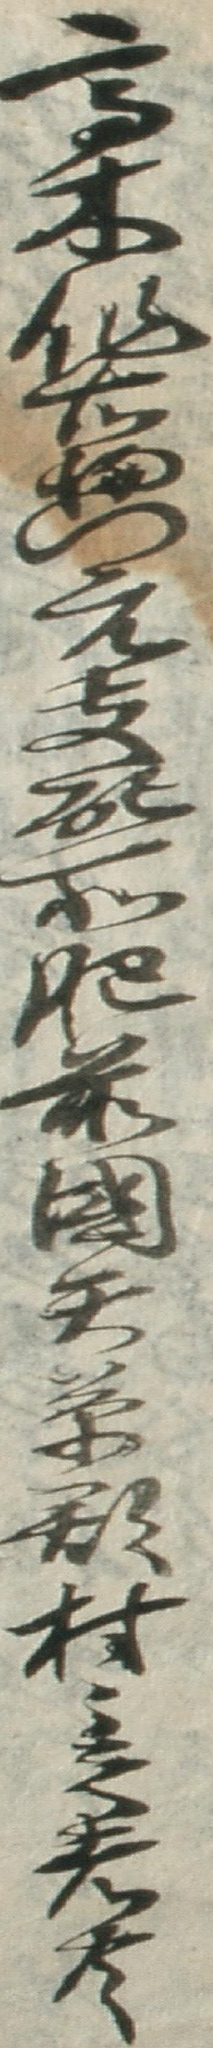高木作右衛門元支配所肥前国天草郡村々之者共
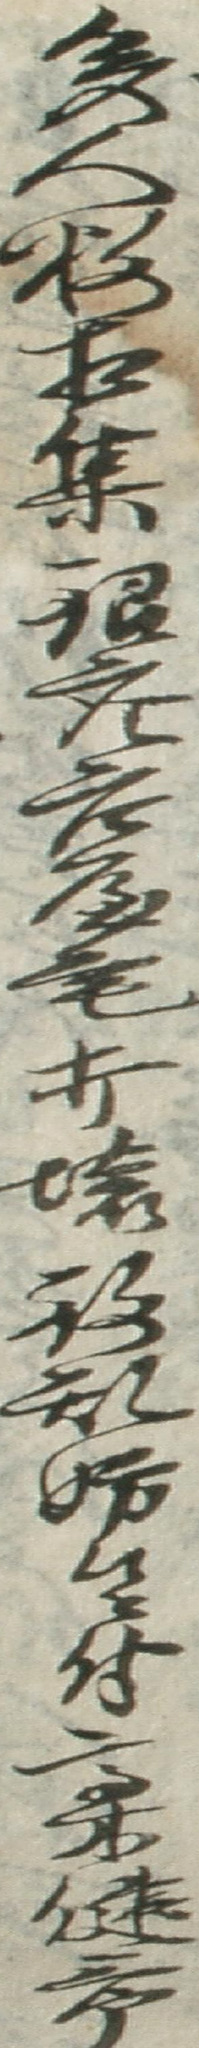多人数相集銀座庄屋宅打壊致乱妨候二付高木健三郎
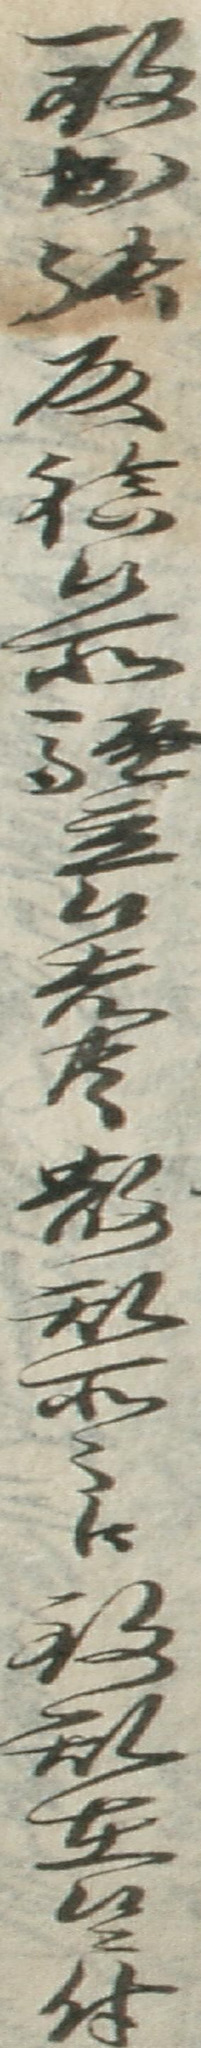致出張取鎮候所騒立候者共散乱所々江致乱在候二付
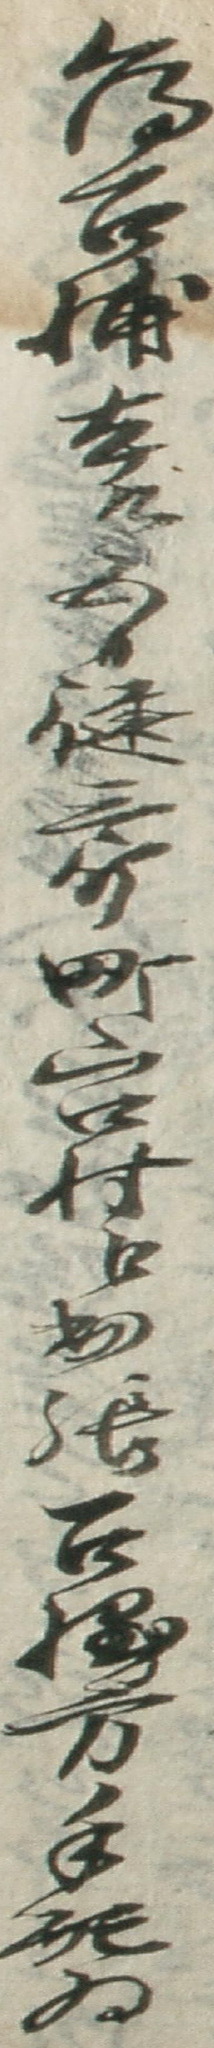為召捕去ㇽ五日健三郎町山口村江出張召捕方手配為

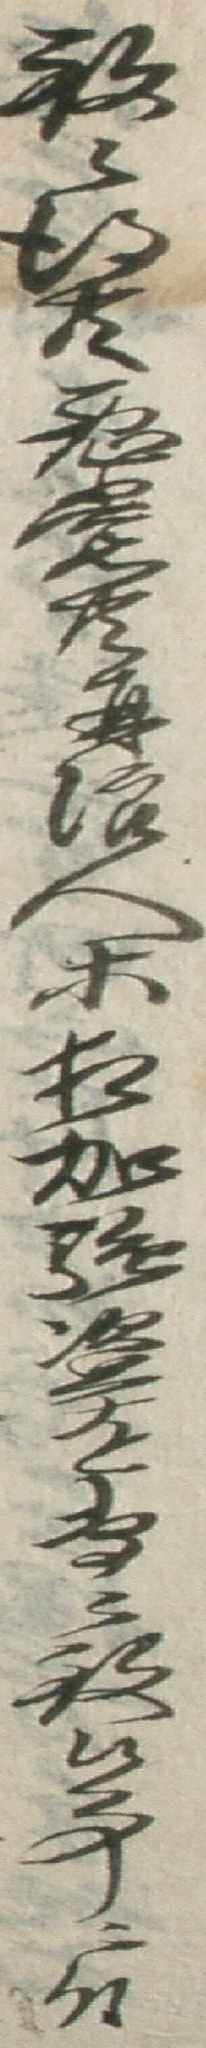致候得共悪党共并浪人等相加強盗を専ニ致候事二付
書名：信濃國地震實録記
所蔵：東京大学地震研究所図書室 Earthquake Research Institute Library, The University of Tokyo, JAPAN
